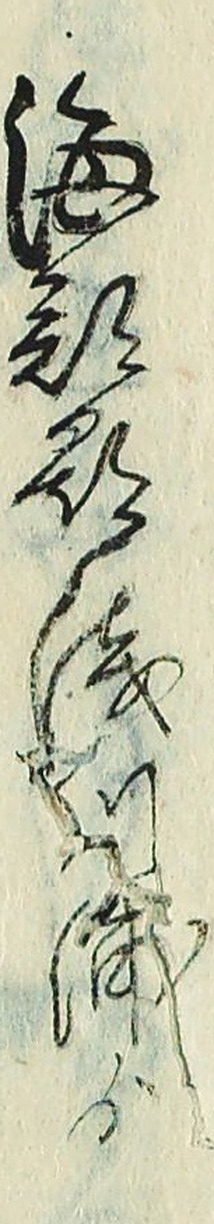海部郡浅川浦ゟ
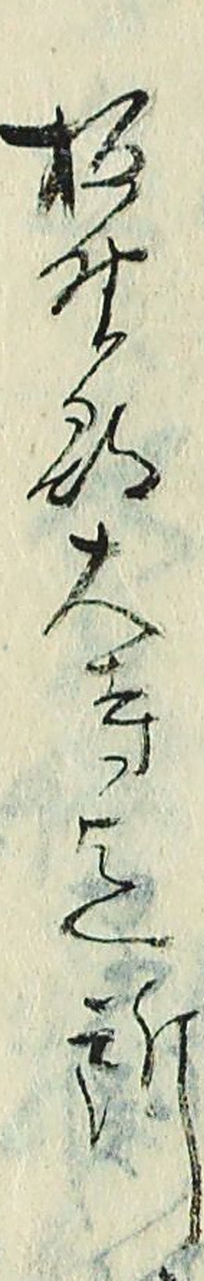板野郡大寺迄所々
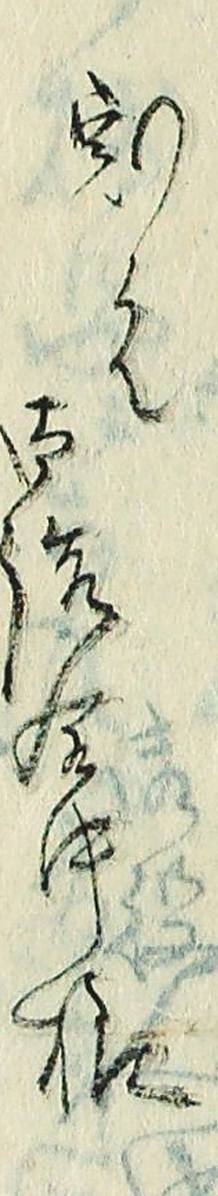御詰合中様
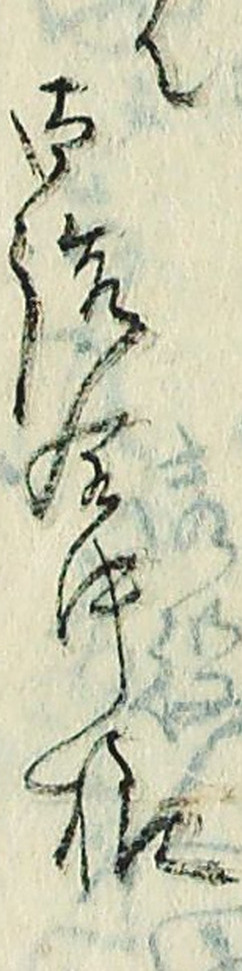御詰合中様
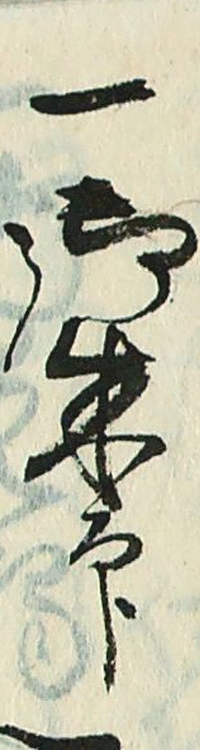一御朱印
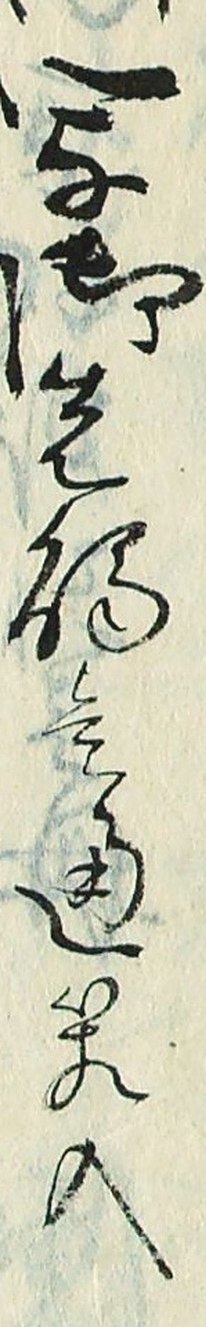写御先触壱通箱入

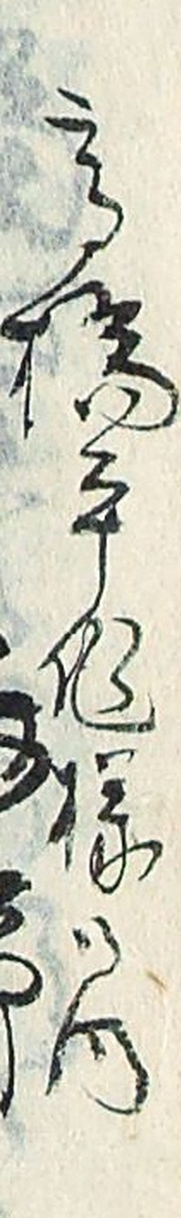高橋平作様御内
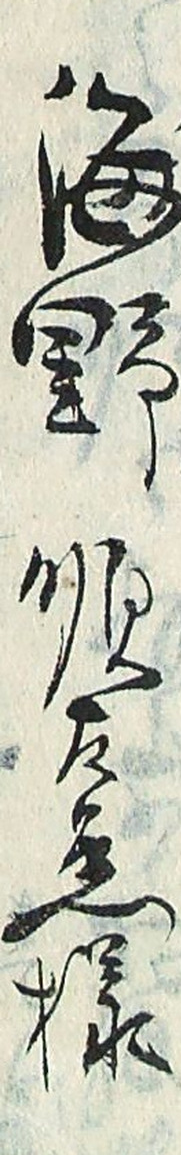海野順左衛門様
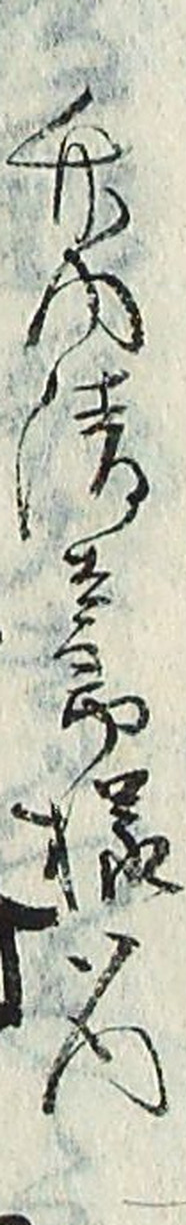竹内清太郎様御内
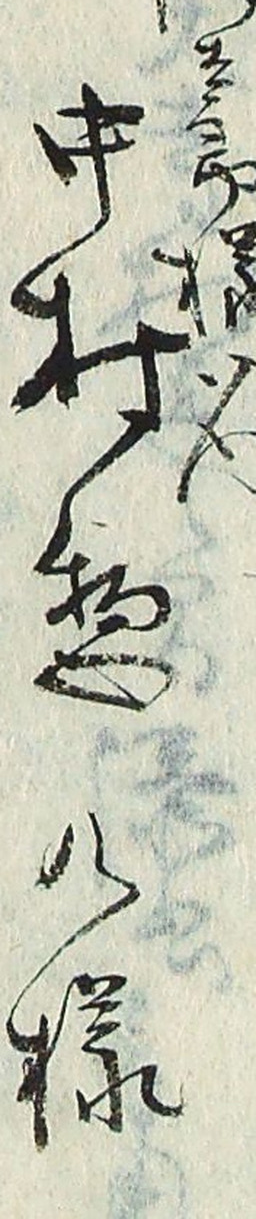中村惣八様
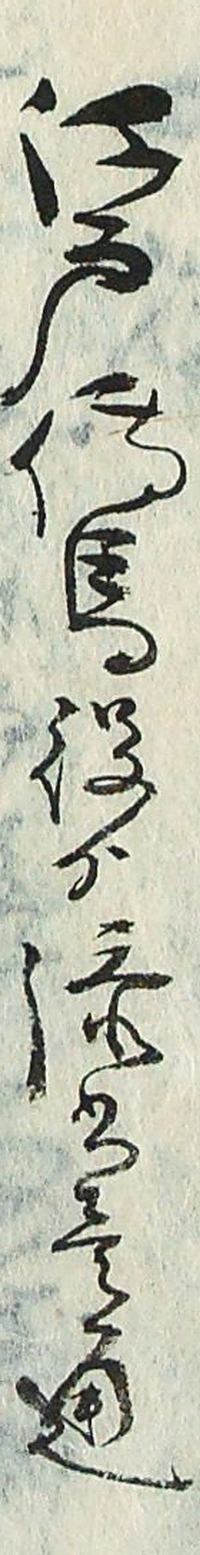江戸伝馬役ゟ添書壱通
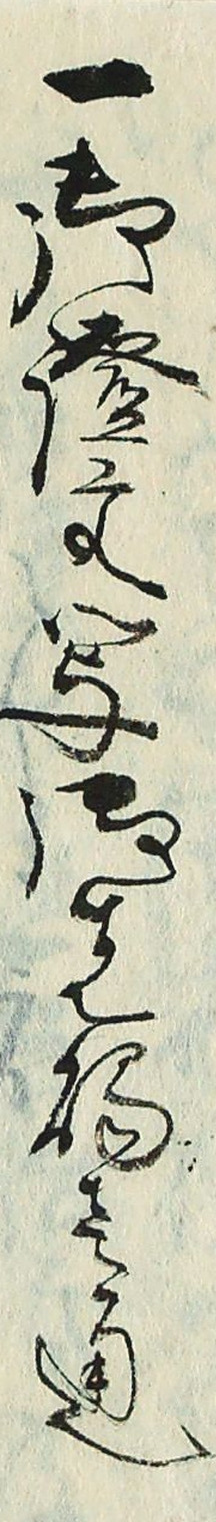一御証文写御先触壱通
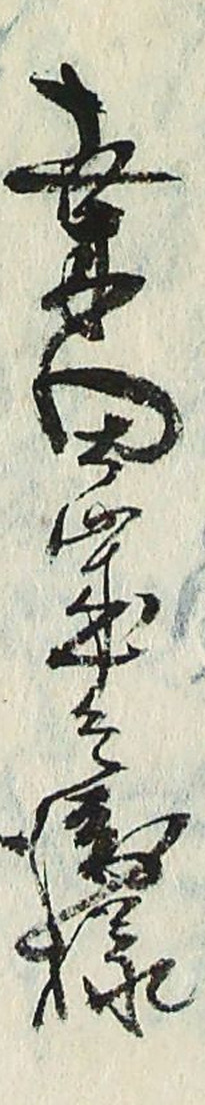桑田歳兵衛様
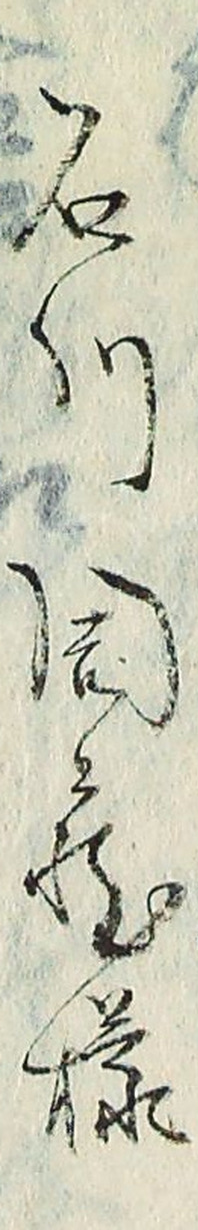石川周蔵様
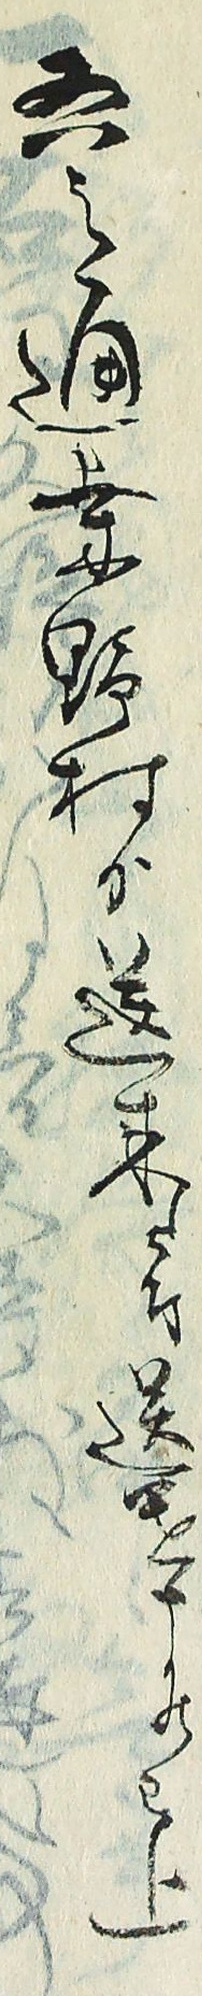右之通桑野村ゟ送来候に付送遣申候已上
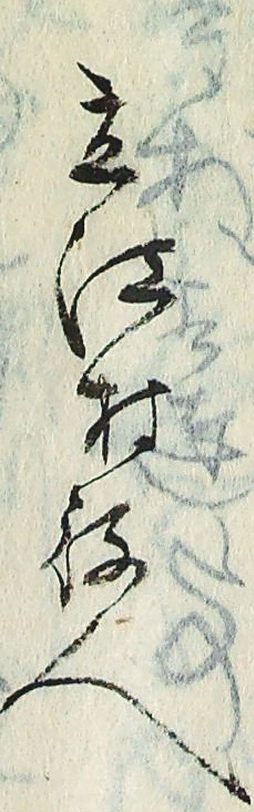立江村役人
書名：公辺御役人為御廻浦御立越諸御用一巻
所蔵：鳴門教育大学 Naruto University of Education
